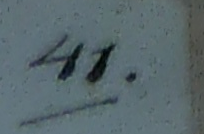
41.
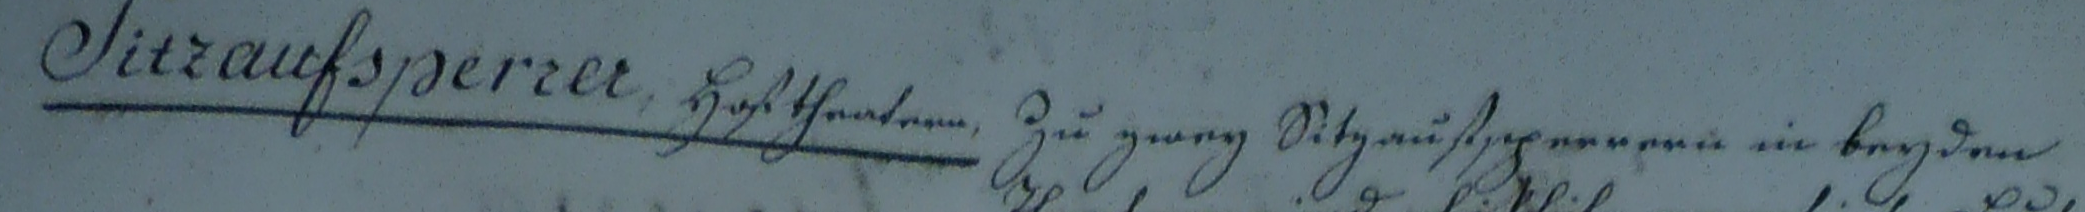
Sitzaufsperrer, Hoftheatern, Zu zwey Sitzaufsperrern in beyden
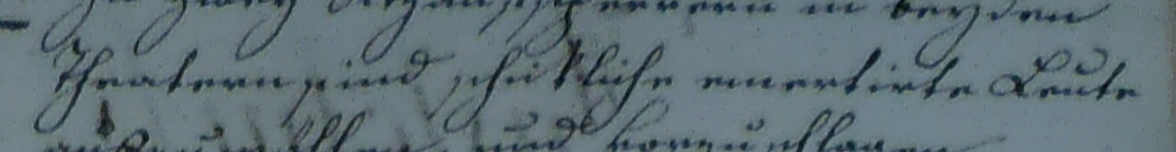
Theatern sind schickliche emertirte Leute
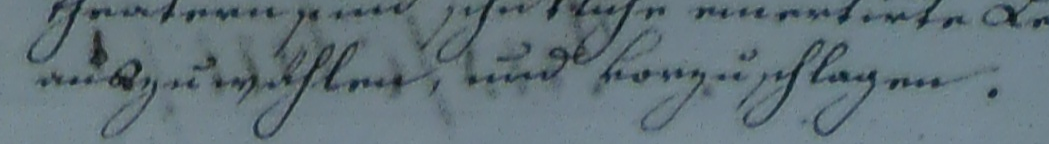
auszuwählen, und vorzuschlagen.
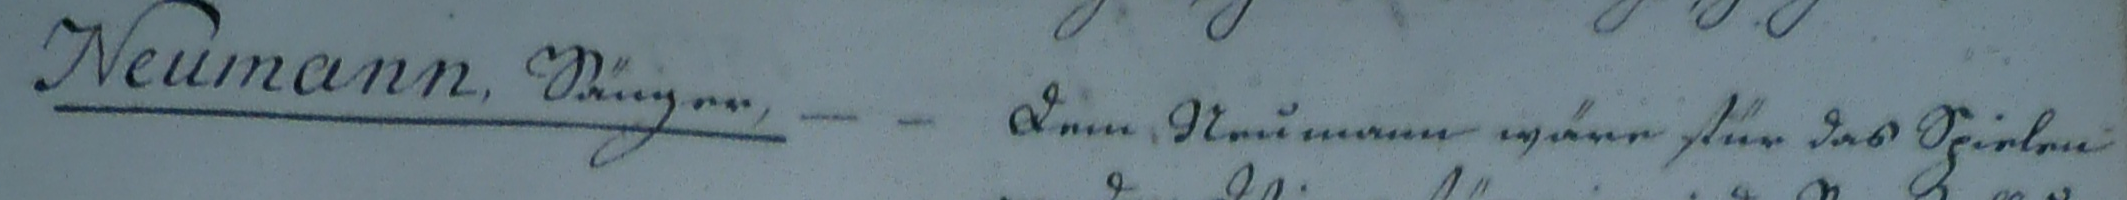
Neumann, Sänger, _ _ Dem Neumann wäre für das Spielen
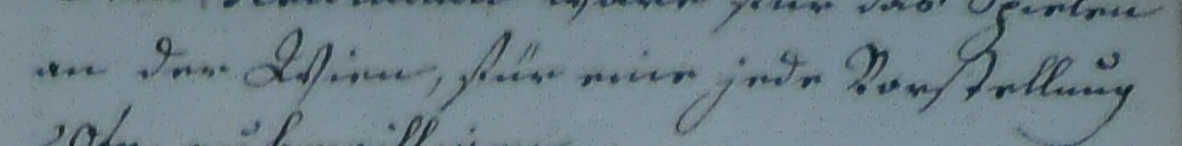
an der Wien, für eine jede Vorstellung
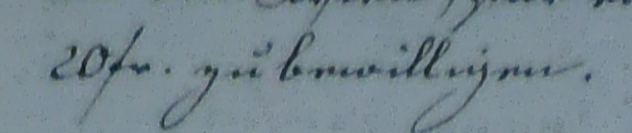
20fr. zubewilligen.
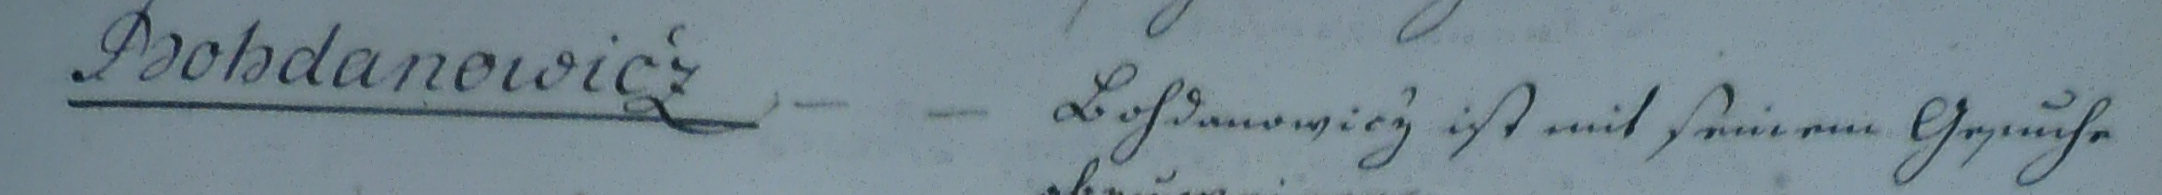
Bohdanowićz _ _ Bohdanowićz ist mit seinem Gesuche
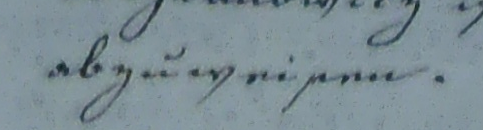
abzuweisen.
